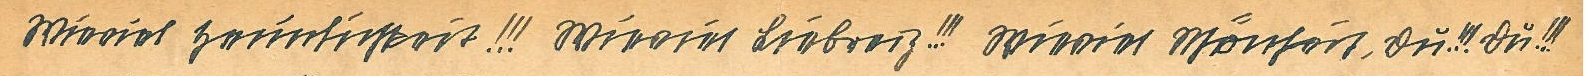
Wieviel Heimlichkeit!!! Wieviel Liebreiz!!! Wieviel Schönheit, Du!!! Du!!!
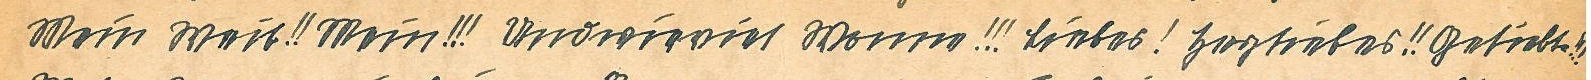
Mein Weib!! Mein!!! Und wieviel Wonne!!! Liebes! Herzliebes!! Geliebte!!!
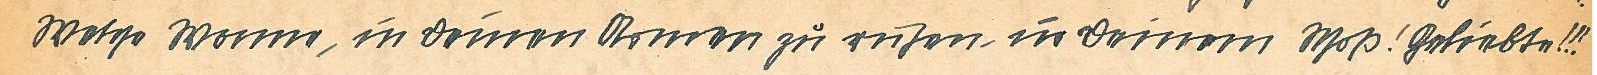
Welche Wonne in Deinen Armen zu ruhen, in Deinem Schoß! Geliebte!!!
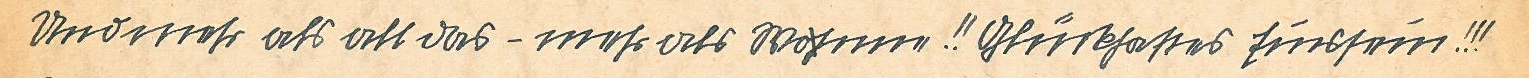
Und mehr als all das — mehr als Wohnne!! Glückhaftes Einssein!!!
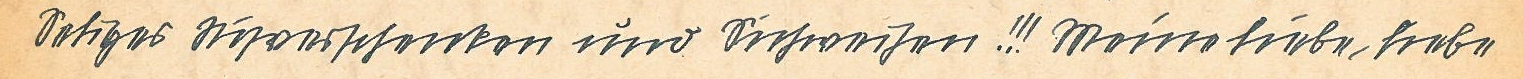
Seliges Sichverschenken und Sichweihen!!! Meine liebe, liebe
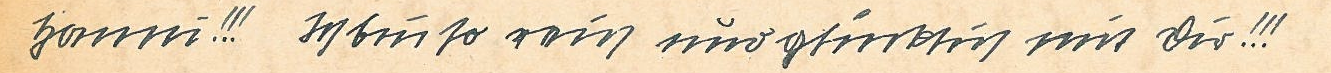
!!! Ich bin so rein und glücklich mit Dir!!!
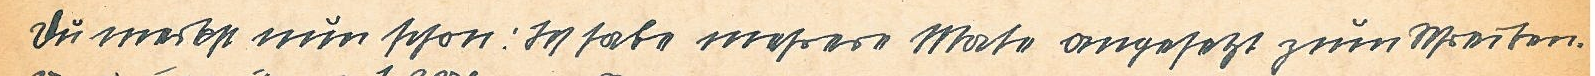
Du merkst nun schon: Ich habe mehrere Male angesetzt zum Schreiben.
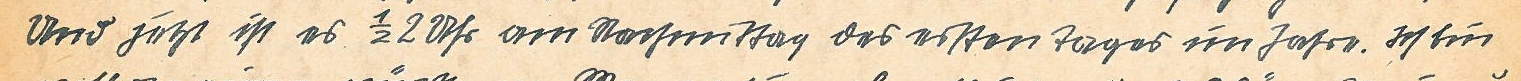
Und jetzt ist es ½ 2 Uhr am Nachmittag des ersten Tages im Jahre. Ich bin
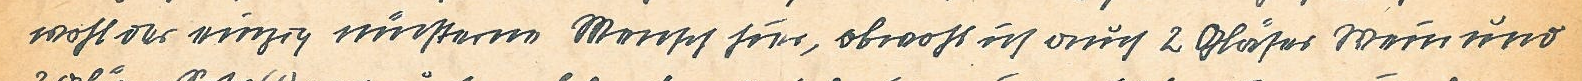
wohl der einzig nüchterne Mensch hier, obwohl ich auch 2 Gläser Wein und
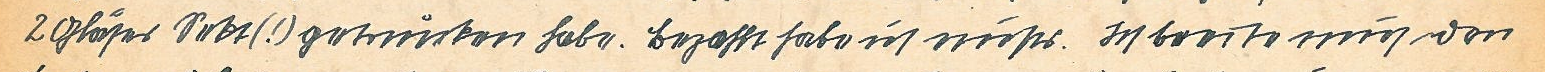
2 Gläser Sekt (!) getrunken habe, bezahlt habe ich nichts. Ich beeile mich, den
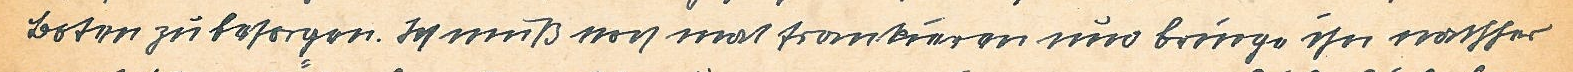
Boten zu besorgen. Ich muß noch mal frankieren und bringe ihn nachher
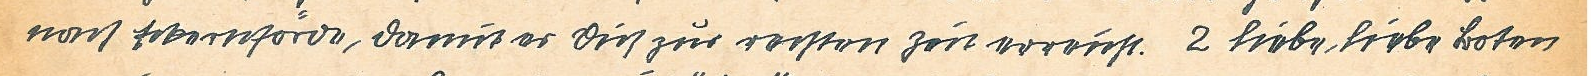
nach Eckernförde, damit er Dich zur rechten Zeit erreicht. 2 liebe, liebe Boten
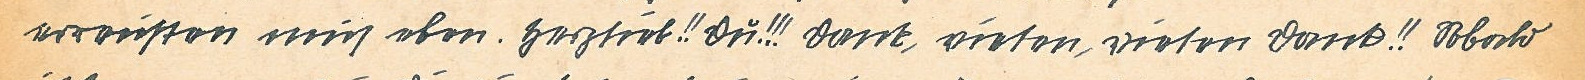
erreichten mich eben. Herzliebes!! Du!!! Dank, vielen, vielen Dank!! Sobald
